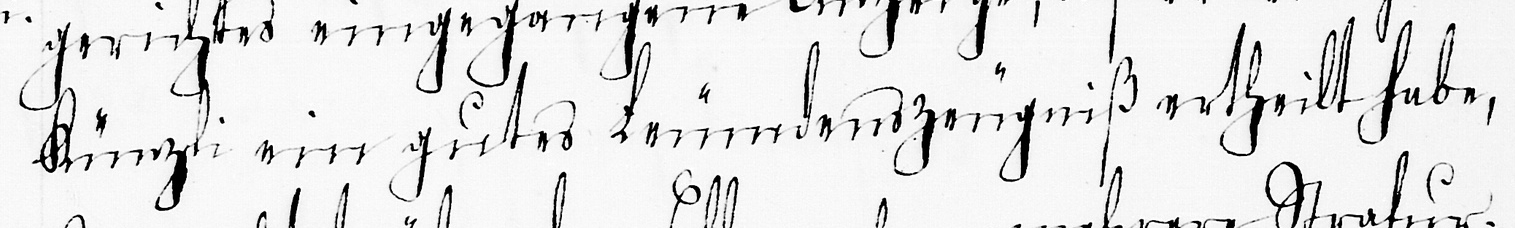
Künzli ein gutes Leumdenszeugniß ertheilt habe,
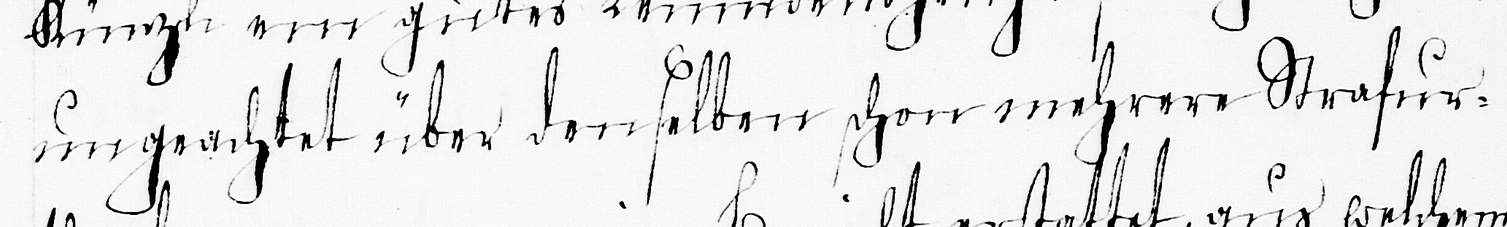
ungeachtet über denselben schon mehrere Strafur¬
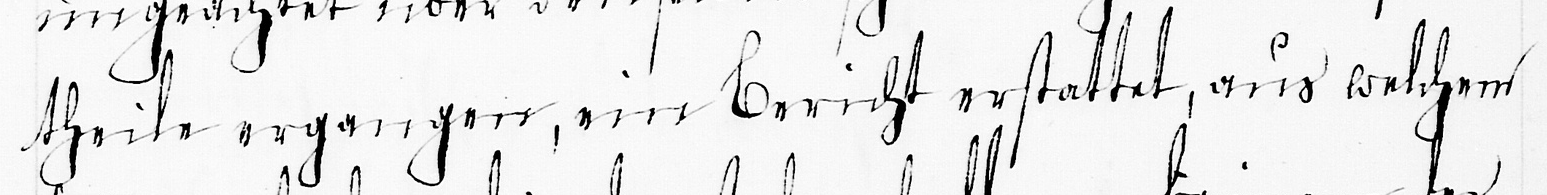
theile ergangen, ein Bericht erstattet, aus welchem
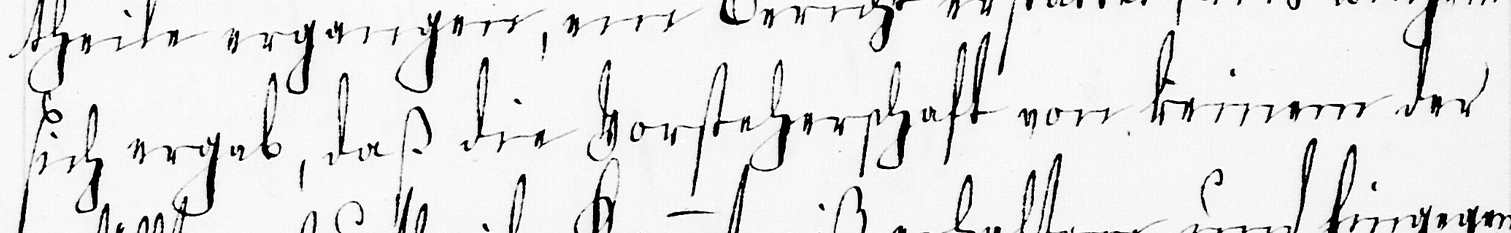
sich ergab, daß die Vorsteherschaft von keinem der
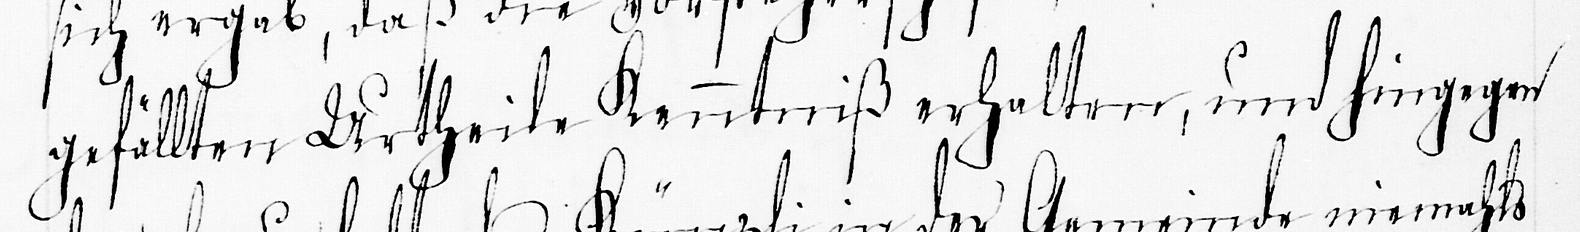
gefällten Urtheile Kenntniß erhalten, und hingegen
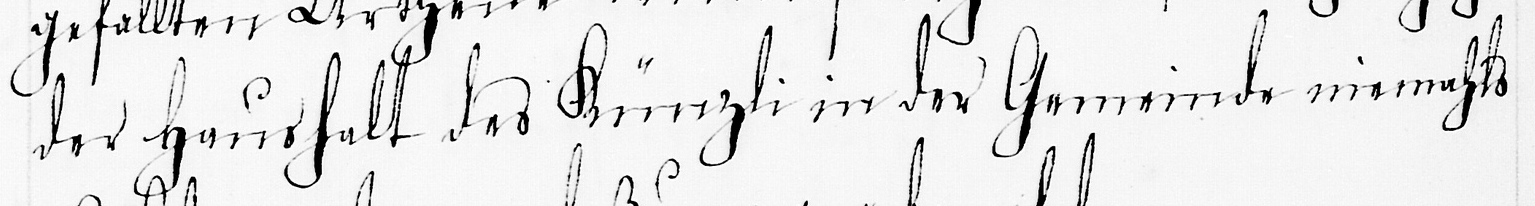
der Haushalt des Künzli in der Gemeinde niemahls
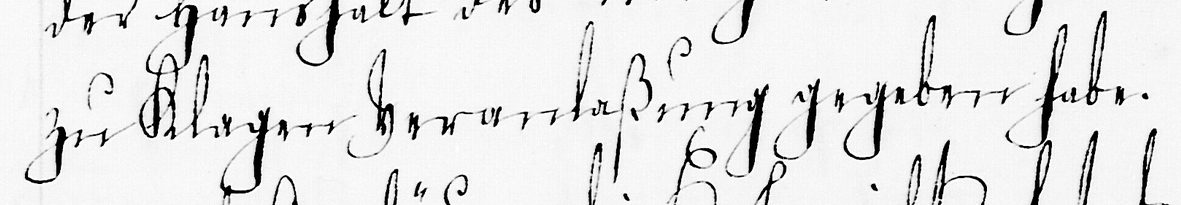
zu Klagen Veranlaßung gegeben habe.
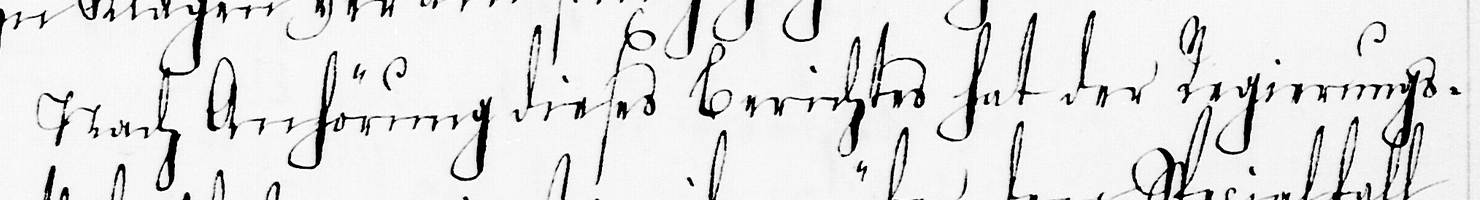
Nach Anhörung dieses Berichtes hat der Regierungs¬
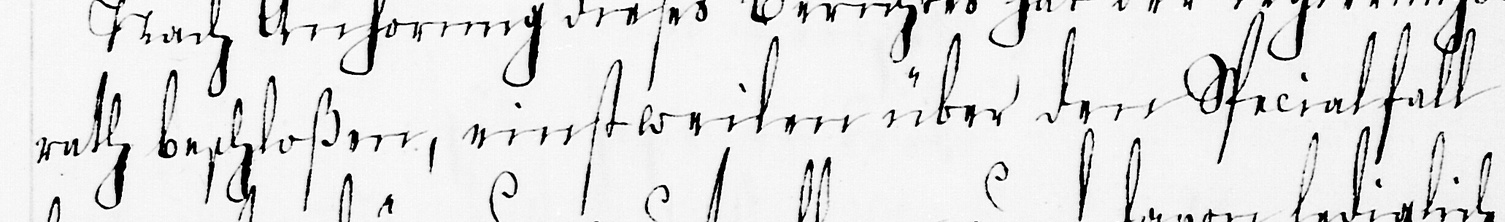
rath beschloßen, einstweilen über den Specialfall
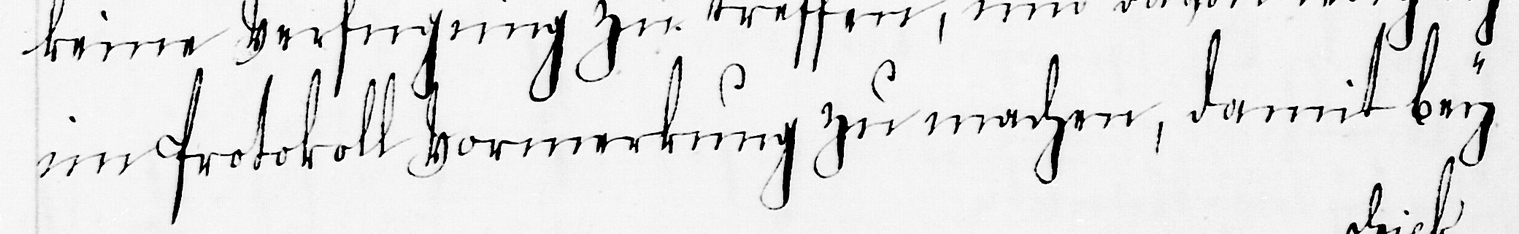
im Protokoll Vormerkung zu machen, damit bey
